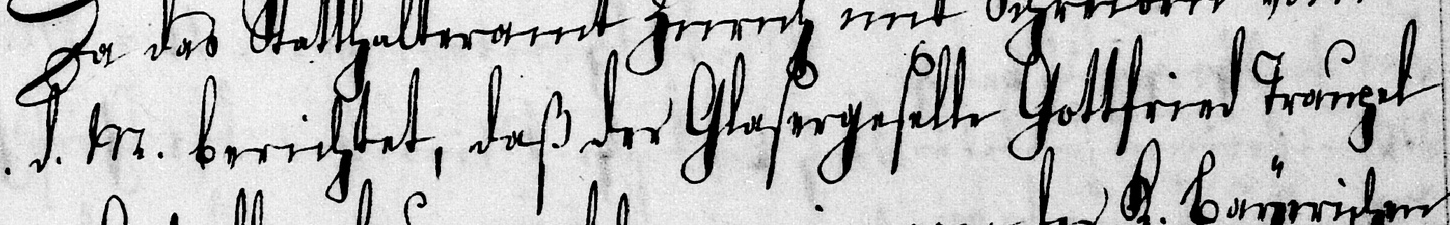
d. M. berichtet, daß der Glasergeselle Gottfried
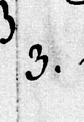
3.
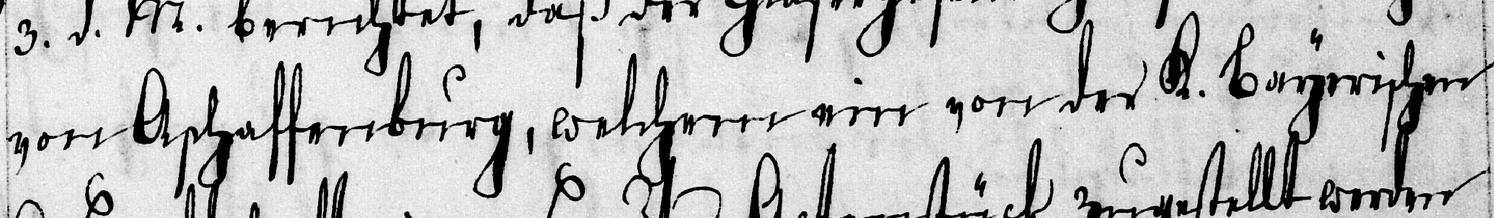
von Aschaffenburg, welchem ein von der K. Bayerischen
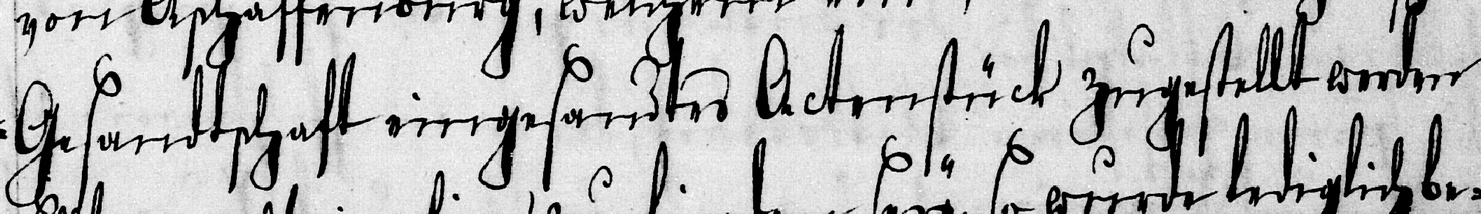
Gesandtschaft eingesandtes Actenstück zugestellt werden
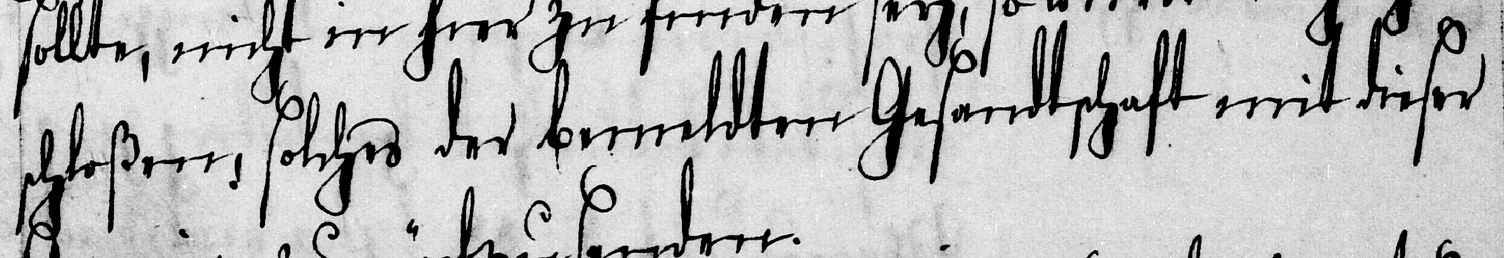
chloßen, solches der bemeldten Gesandtschaft mit dieser
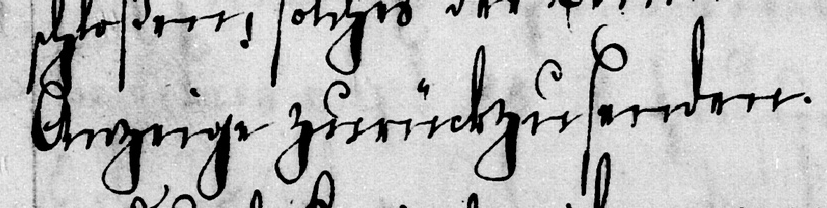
Anzeige zurückzusenden.
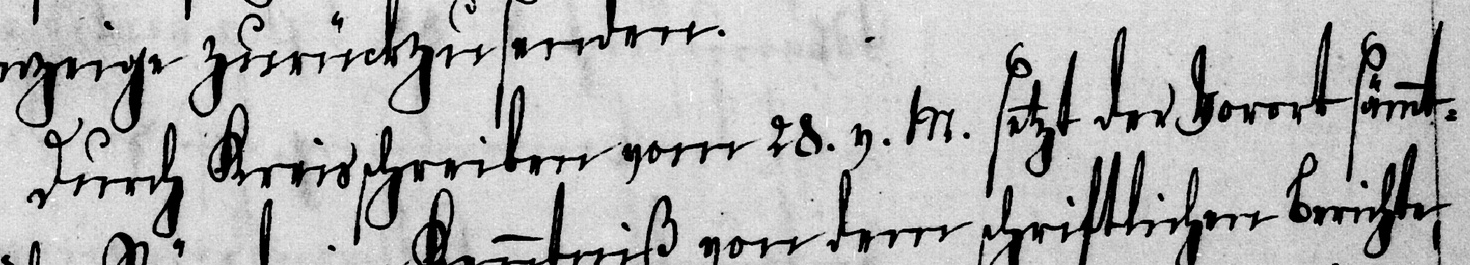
Durch Kreisschreiben vom 28. v. M. setzt der Vorort säm¬
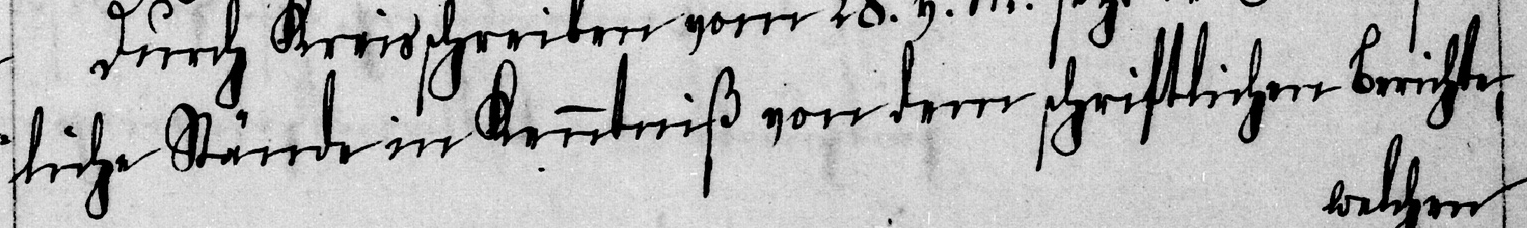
liche Stände in Kenntniß von dem schriftlichen Berichte,
